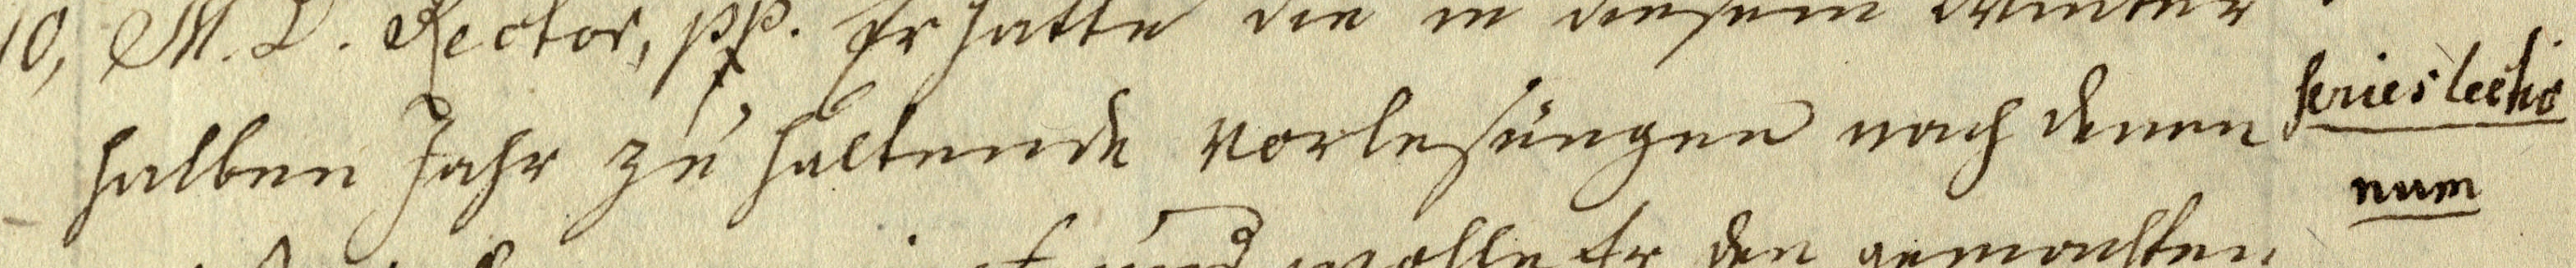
halben jahr zu haltende vorlesungen nach denen series lectio
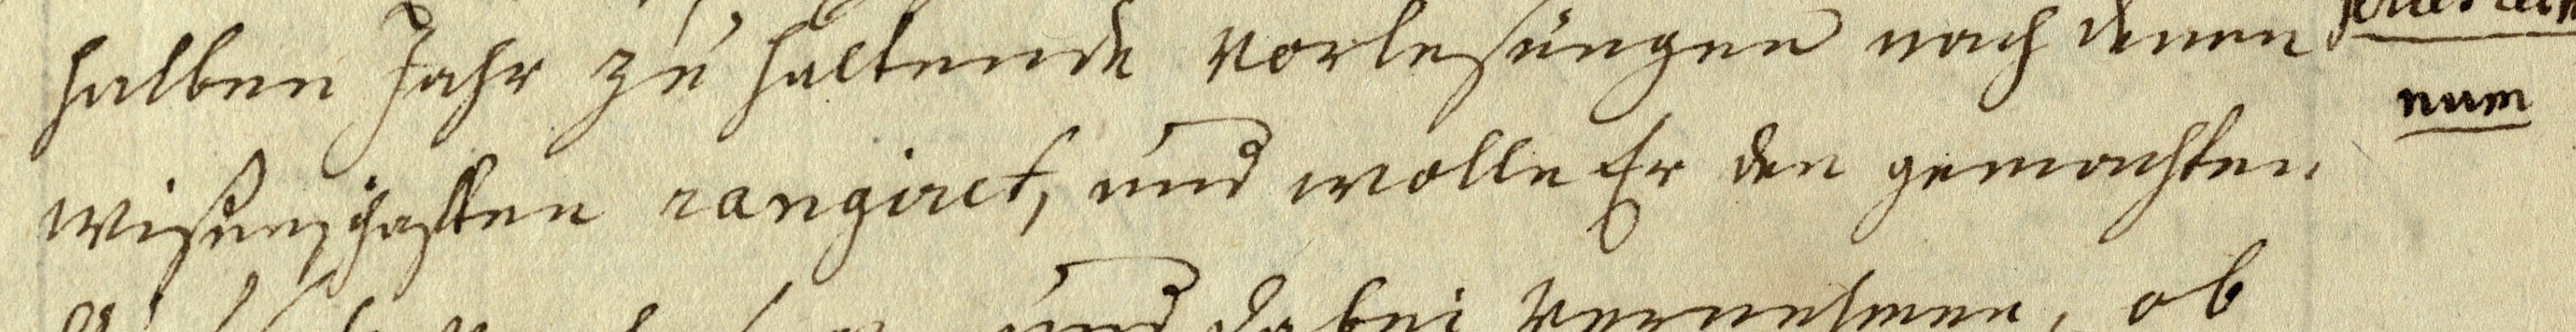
wißenschaften rangiret, und wolle Er den gemachten num
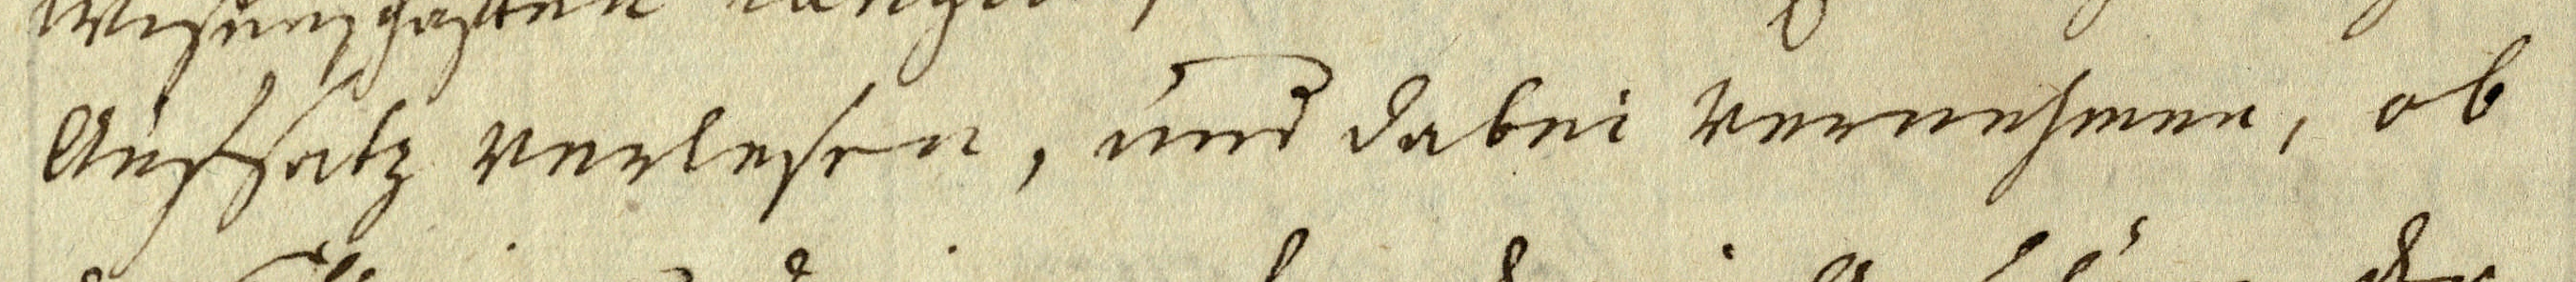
Aufsatz verlesen, und dabei vernehmen, ob
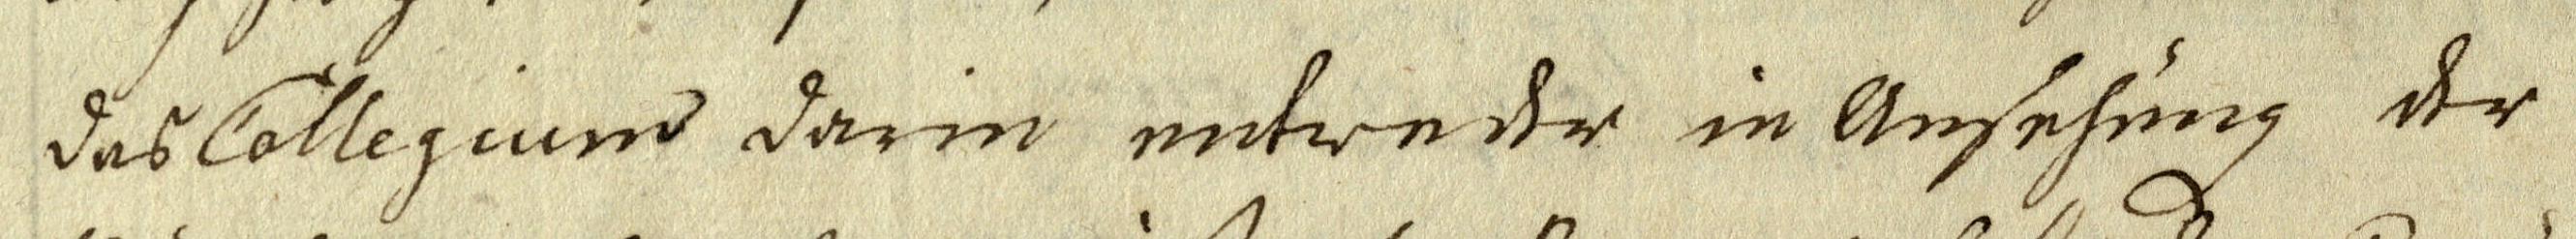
das Collegium darin entweder in Ansehung der
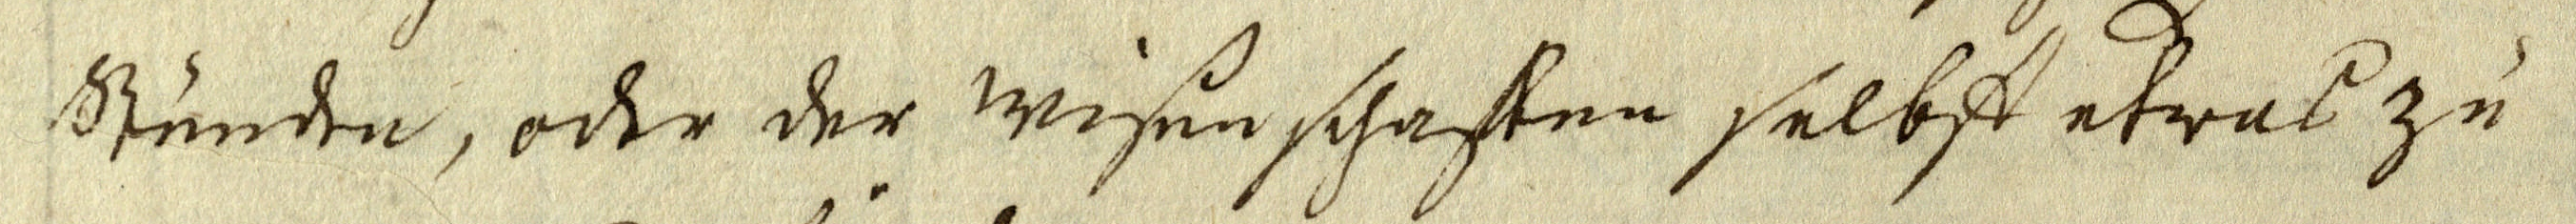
Stunden, oder der Wißenschaften selbst etwas zu
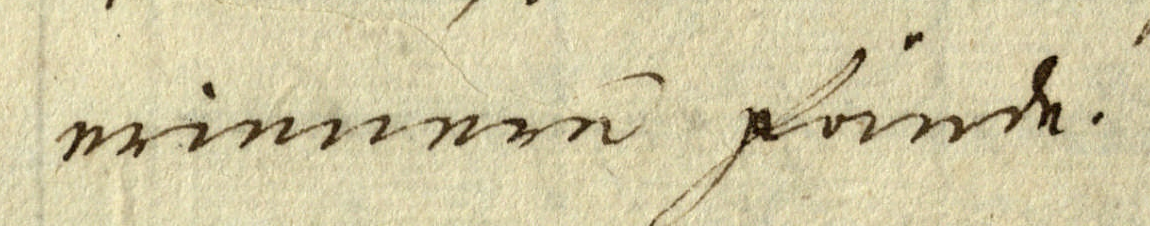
erinnern fände.
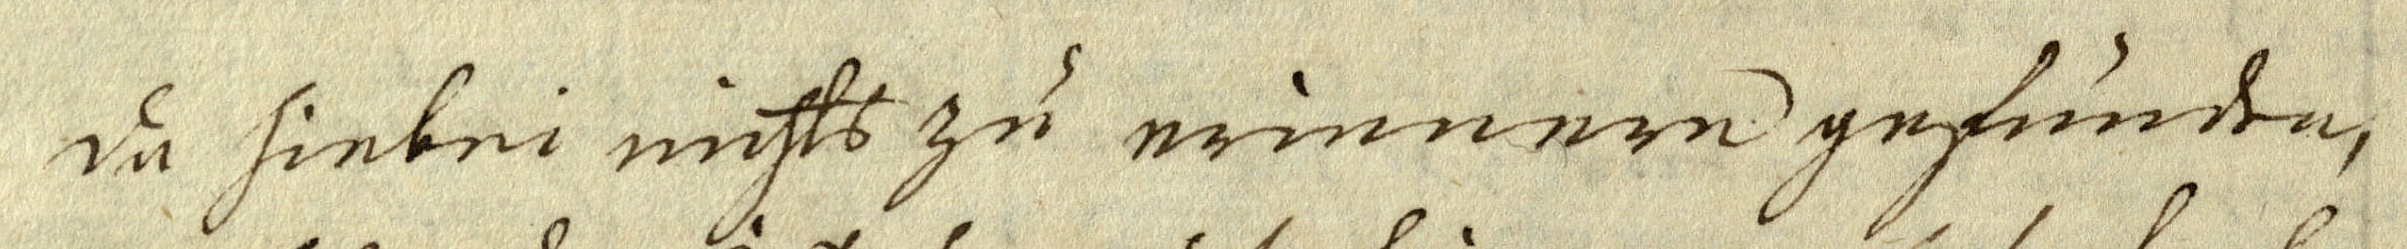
da hiebei nichts zu erinnern gefunden,
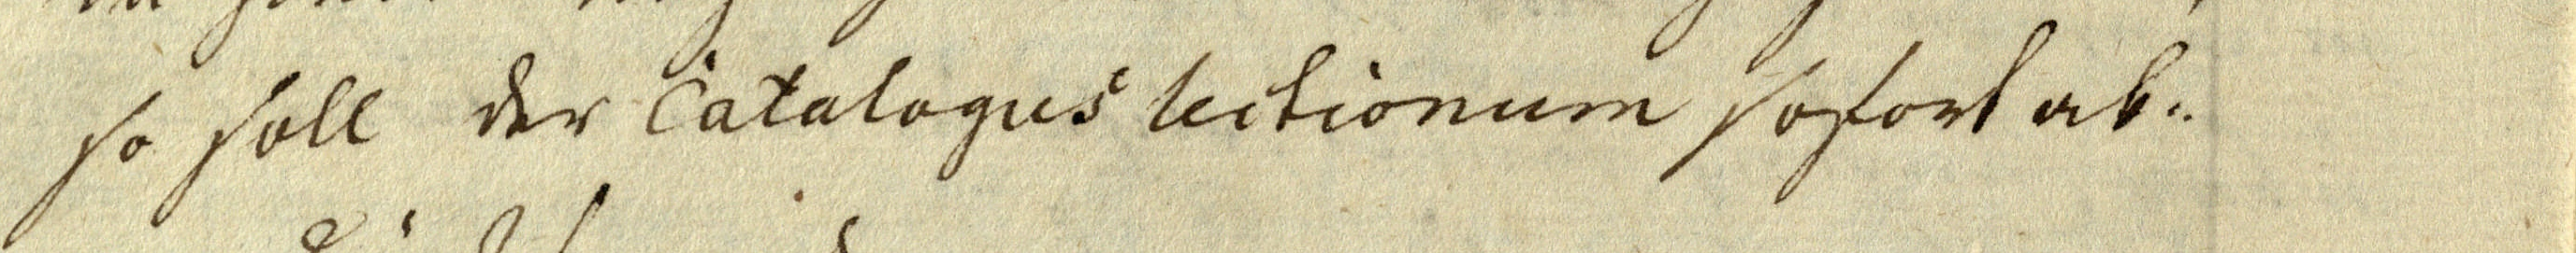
so soll der Catalogus lectionum sofort ab¬
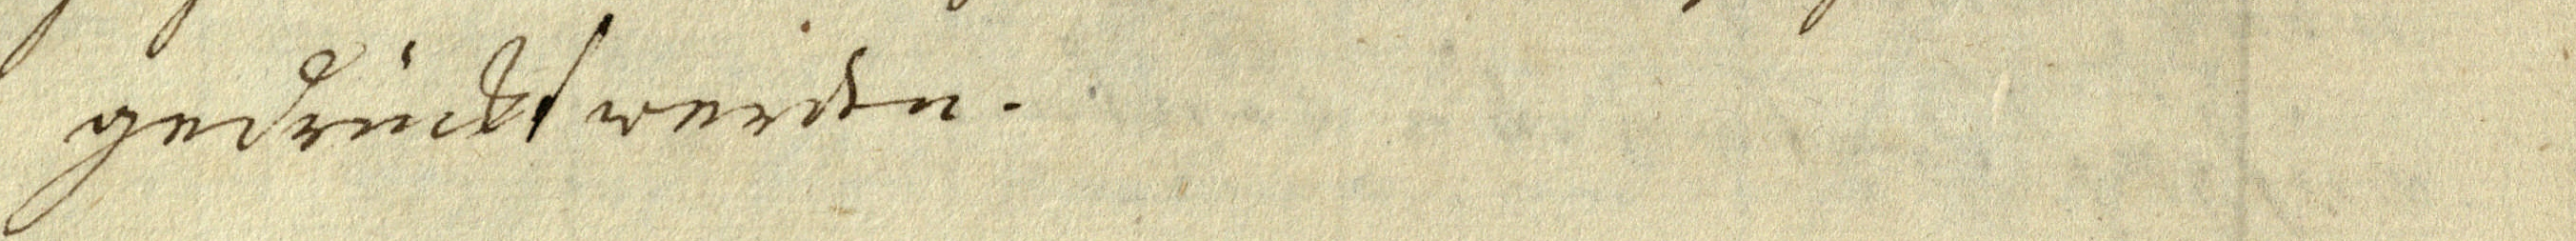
gedruckt werden.
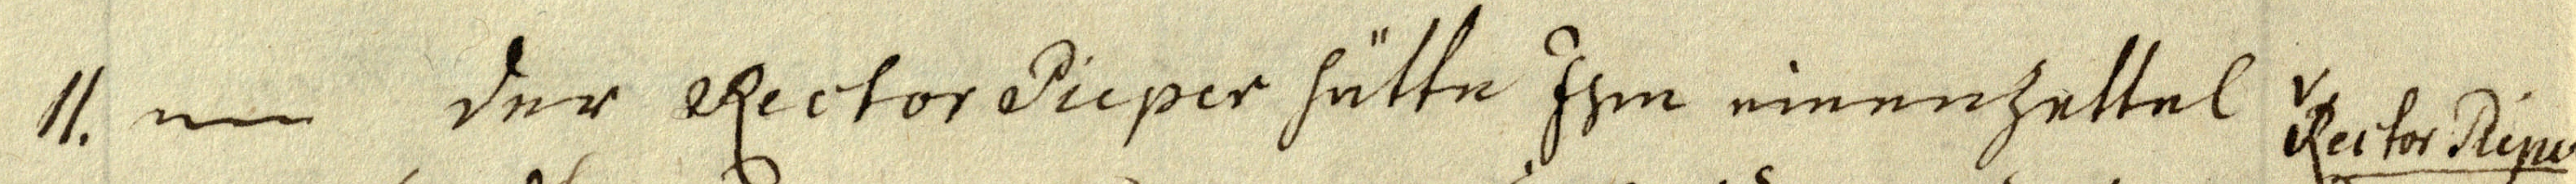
11, der Rector Pieper hätte Ihm einen Zettel
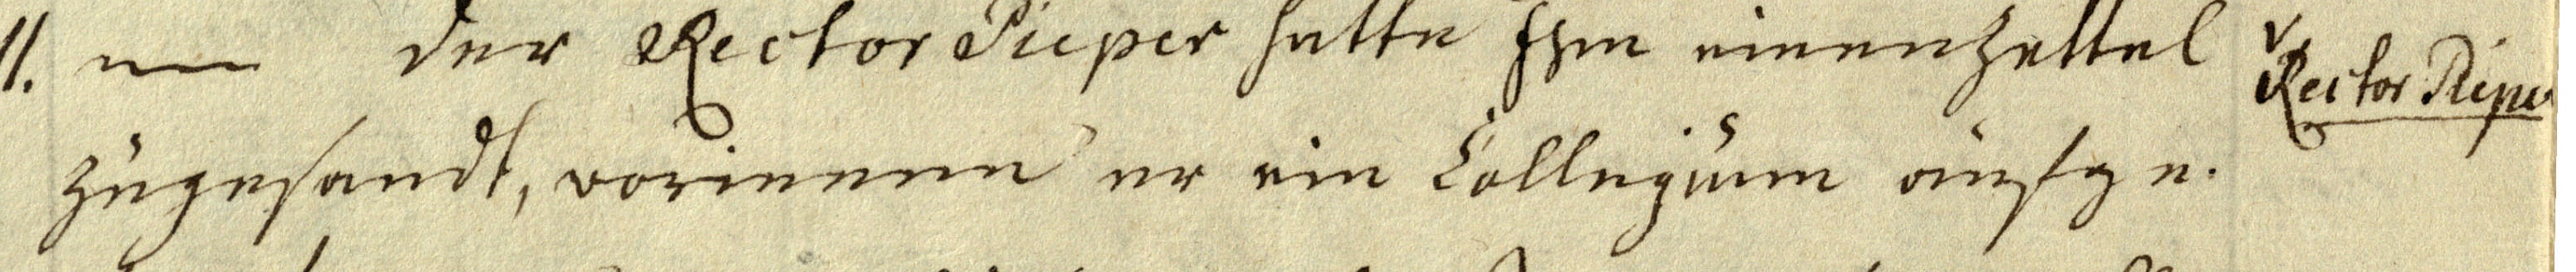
zugesandt, worinnen er ein Collegium aufge- Rector Pieper
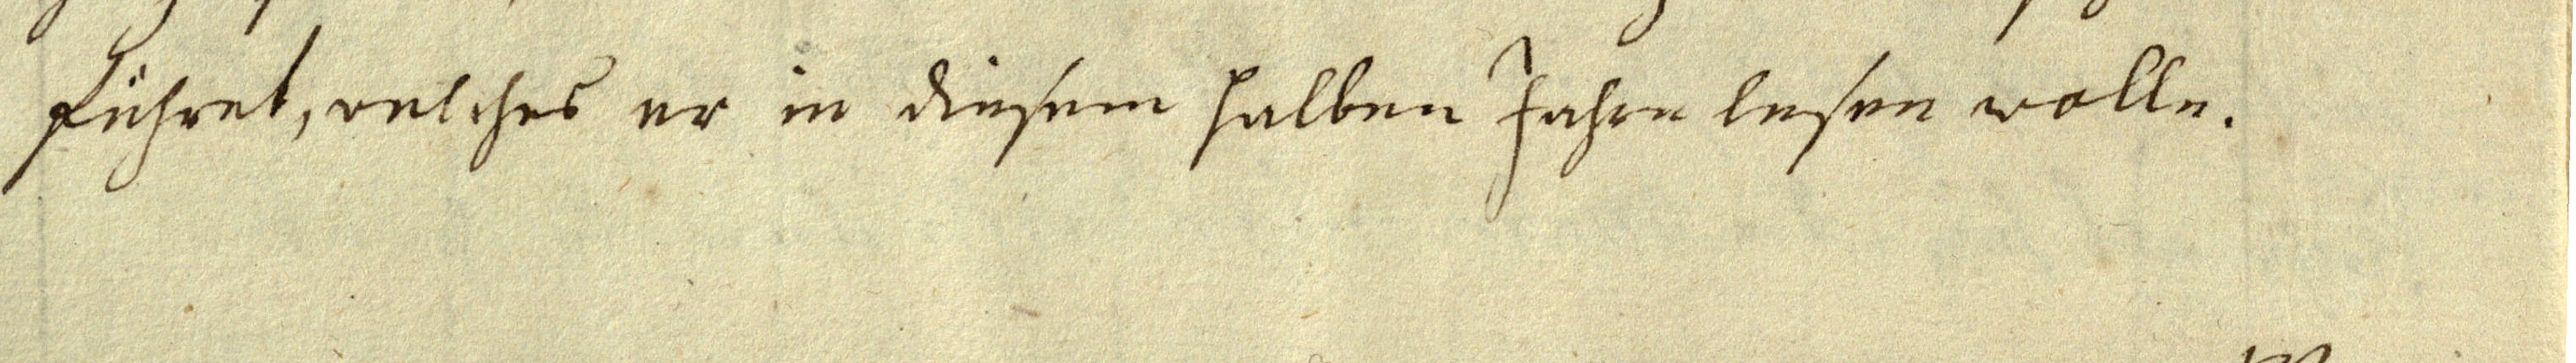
führet, welches er in diesem halben Jahre lesen wolle.
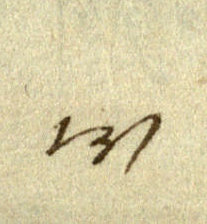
er
